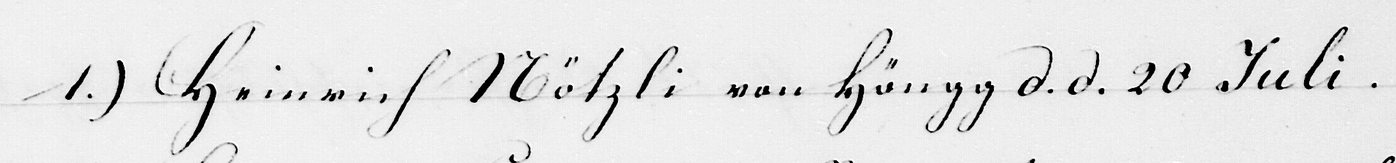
1.) Heinrich Nötzli von Höngg d. d. 20 Juli.
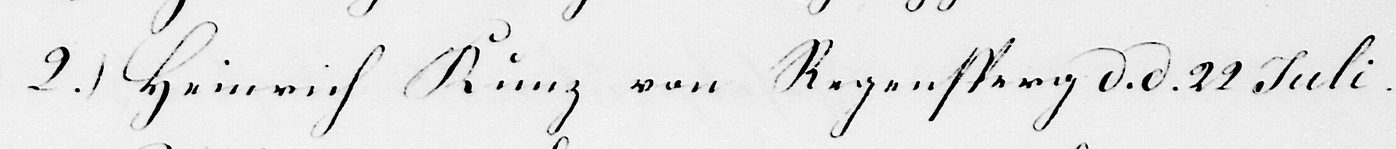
2.) Heinrich Kunz von Regensperg d. d. 22 Juli.
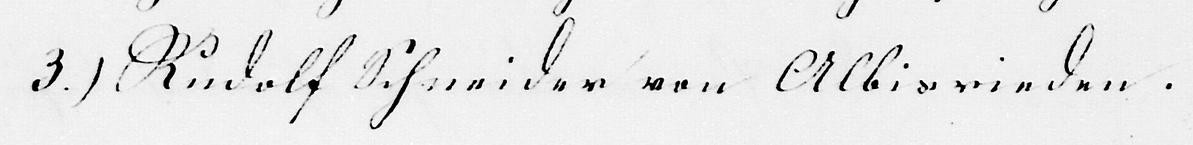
3.) Rudolf Schneider von Albisrieden.
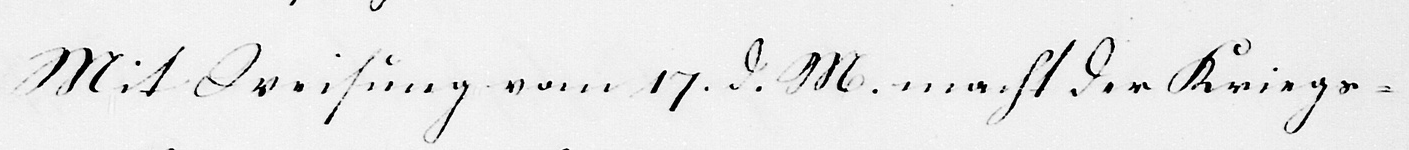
Mit Weisung vom 17. d. M. macht der Kriegs¬
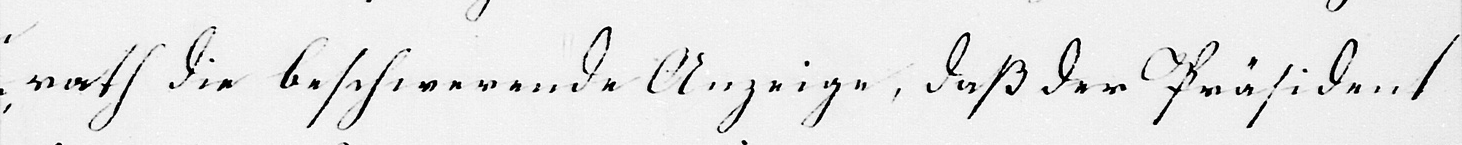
rath die beschwerende Anzeige, daß der Präsident
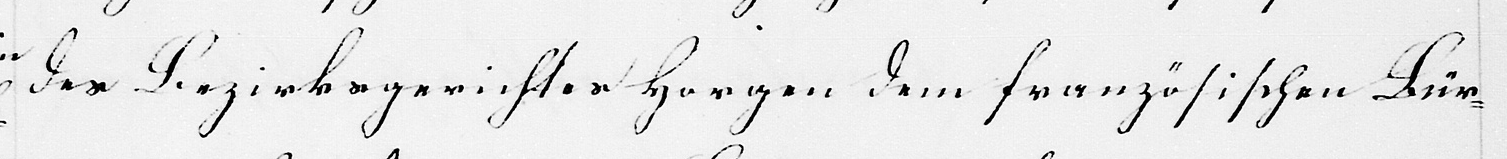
des Bezirksgerichtes Horgen dem französischen Bür¬
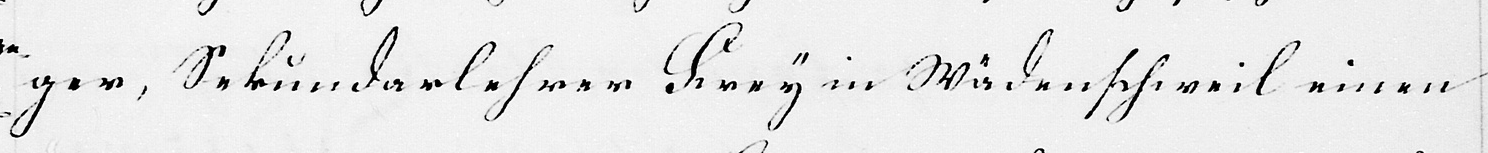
ger, Sekundarlehrer Frey in Wädenschweil einen
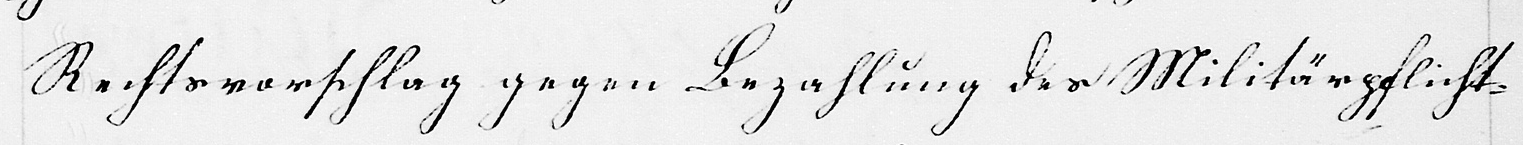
Rechtsvorschlag gegen Bezahlung des Militärpflicht¬
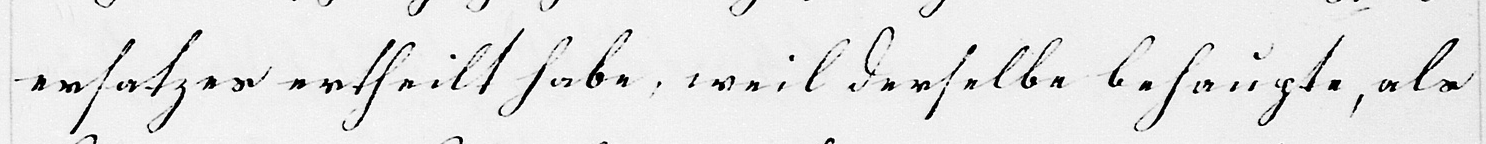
ersatzes ertheilt habe, weil derselbe behaupte, als
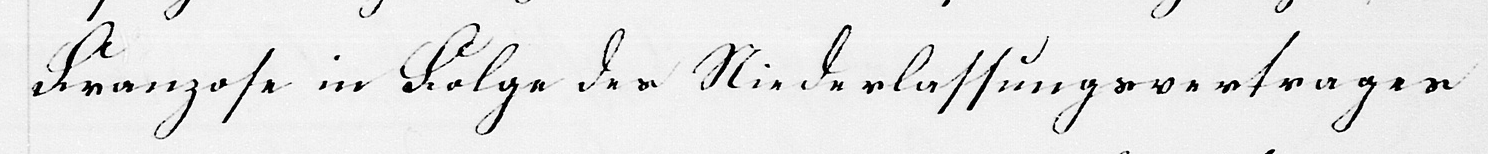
Franzose in Folge des Niederlassungsvertrages
